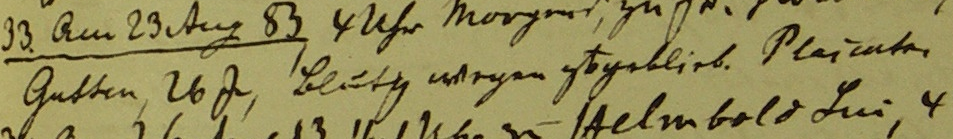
Gattin, 26 J. Blutung wg. zusammengebl. Placinta
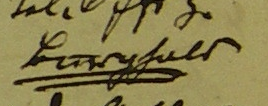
Burggasse
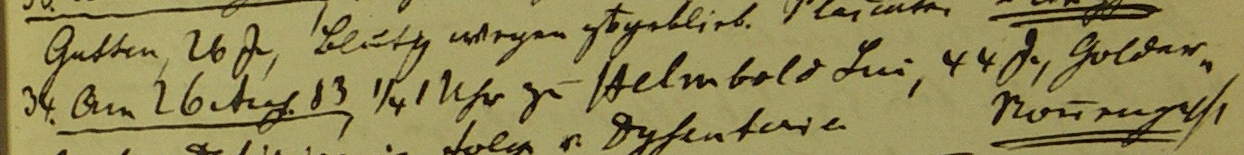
34. Am 26. Aug. 83, ¼ 1 Uhr, zu Helmbold Lud. 44 J., Goldar¬
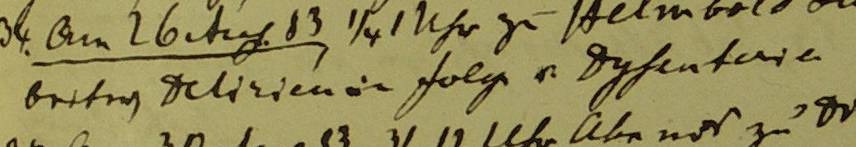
beiter, Delirium in Folge von.Dyfenterie
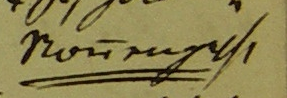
Nonnengasse
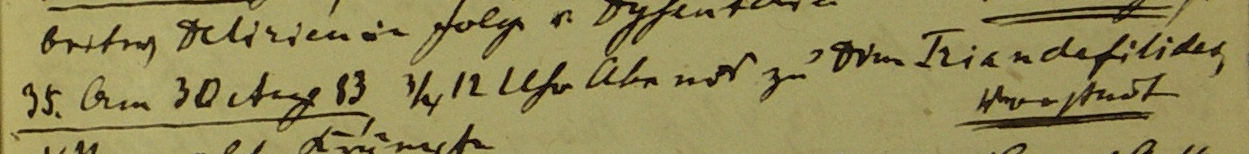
35. Am 30. Aug. 83., 3/4 12 Uhr Abends, zu Dim. Triandefilides,
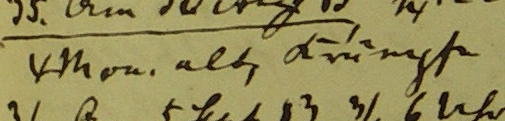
41 J. alt, Krämpfe
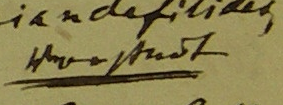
Vorstadt
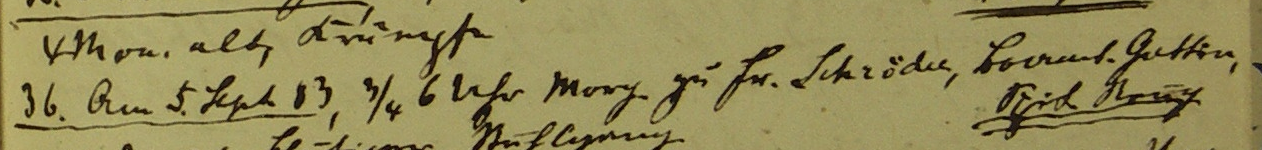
36. Am 5. Sept., 83, ¾ 6 Uhr Morg., zu Fr. Schröder, Beamt. Gattin
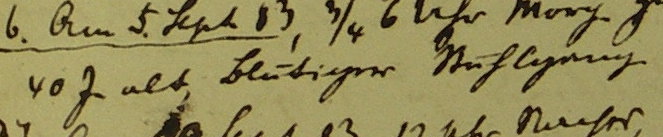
40 J. alt Blutiger Stuhlgang
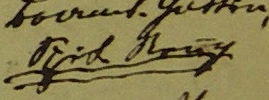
Spit. Ring
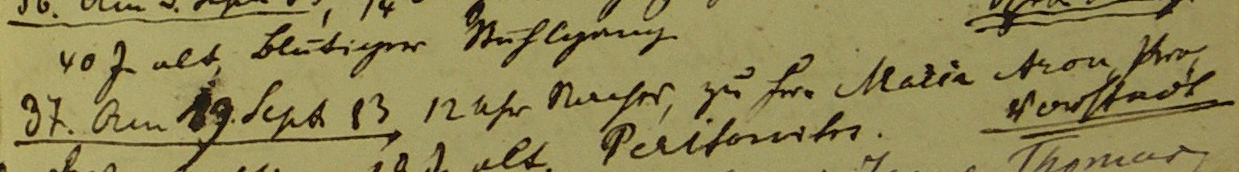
37. Am 19. Sept., 83, 12 Uhr nachts, zu Fr. Maria Aron Pro¬
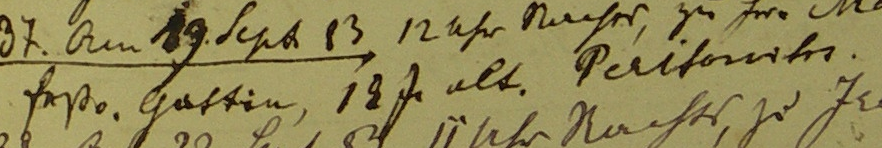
feßo. Gattin , 18 J. alt Peritonitos
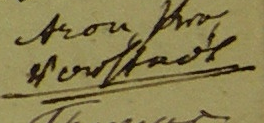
Vorstadt
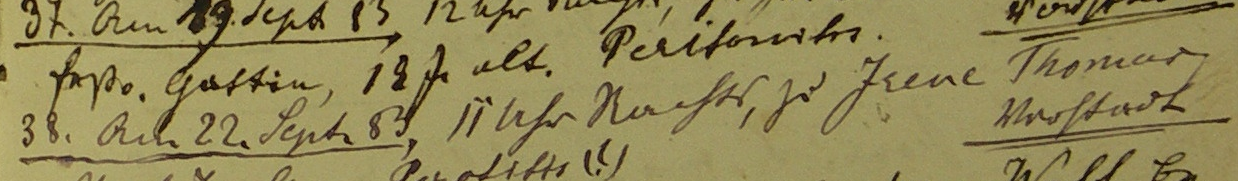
38. Am 22. Sept. 83., 11 Uhr Nachts, zu Irene Thomas,
